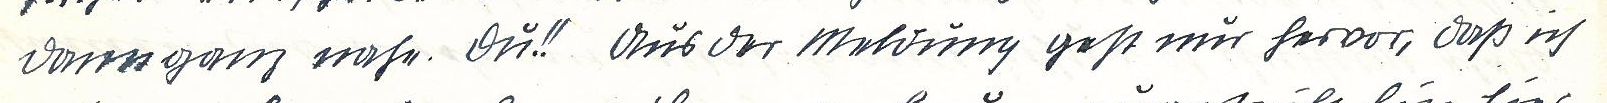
dann ganz nahe. Du!! Aus der Meldung geht nur hervor, daß ich
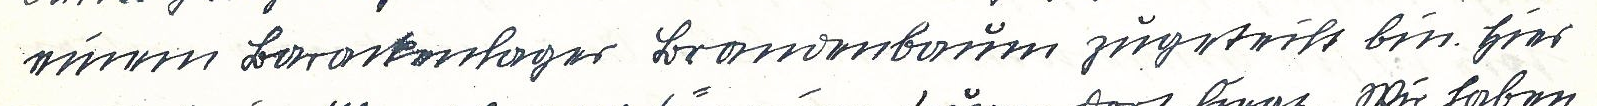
einem Barackenlager Brandenbaum zugeteilt bin. Hier
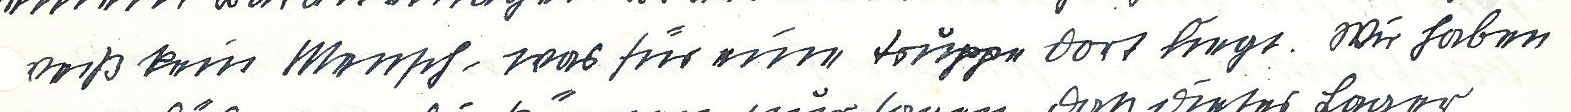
weiß kein Mensch, was für eine Truppe dort liegt. Wir haben
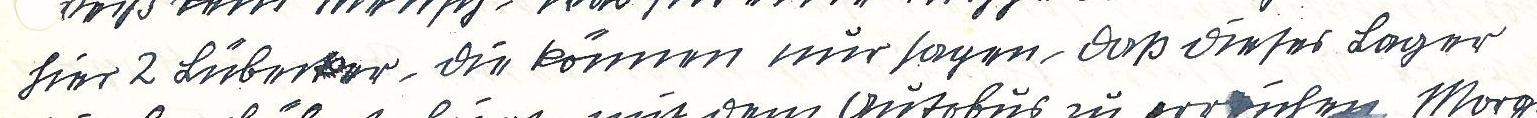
hier 2 Lübecker, die können nur sagen, daß dieses Lager
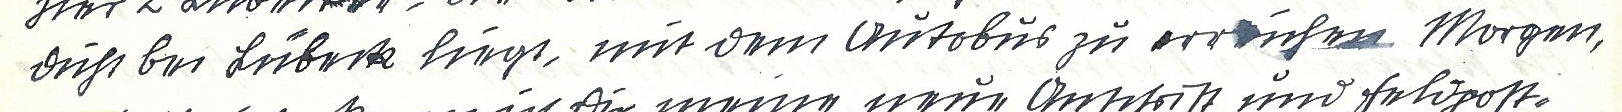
dicht bei Lübeck liegt, mit dem Autobus zu erreichen. Morgen,
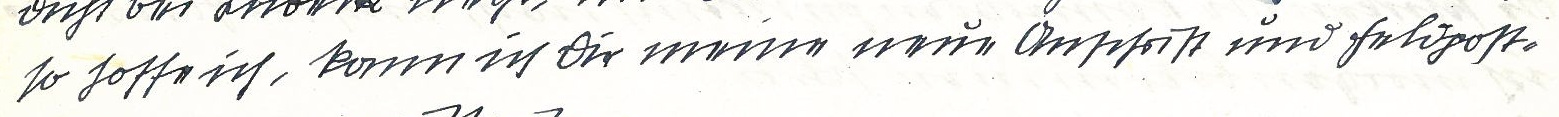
so hoffe ich, kann ich Dir meine neue Anschrift und Feldpost¬
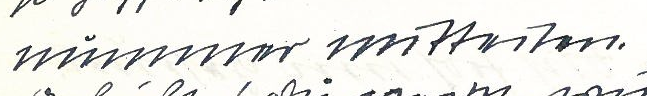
nummer mitteilen.
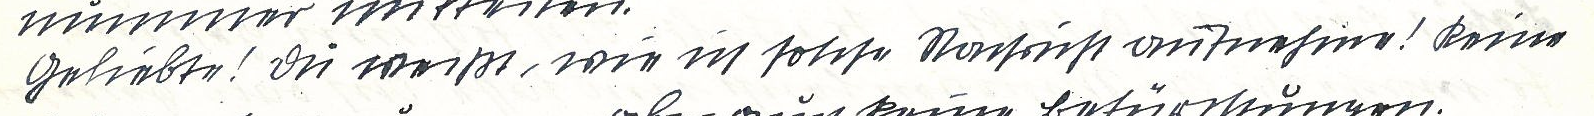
Geliebte, Du weißt, wie ich solche Nachricht aufnehme! Keine
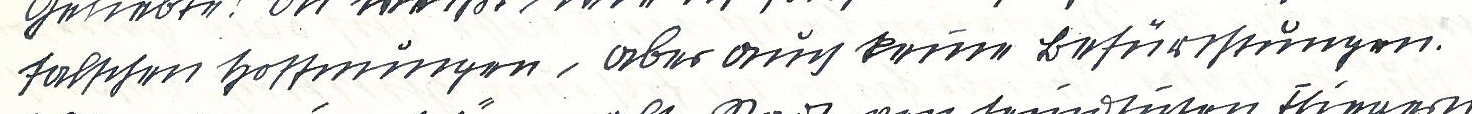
falschen Hoffnungen, aber auch keine Befürchtungen.
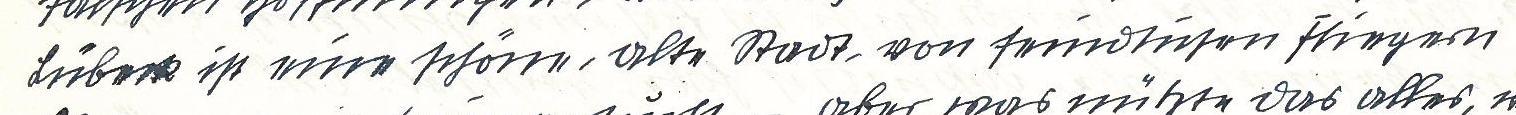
Lübeck ist eine schöne, alte Stadt, von feindlichen Fliegern
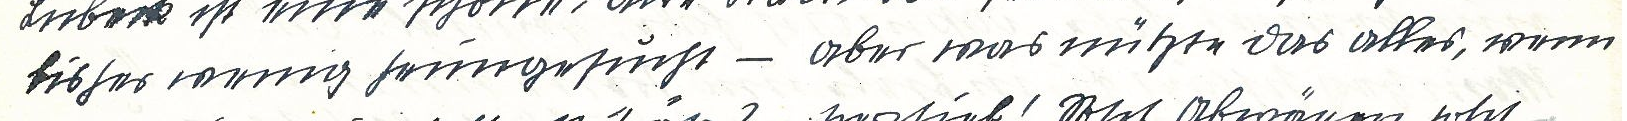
bisher wenig heimgesucht – aber was nützte das alles, wenn
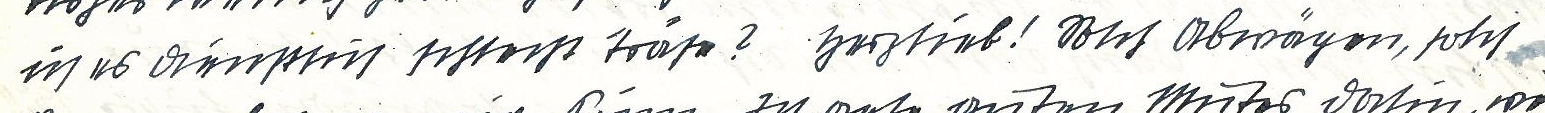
ich es dienstlich schlecht träfe? Herzlieb! Solch Abwägen, solch
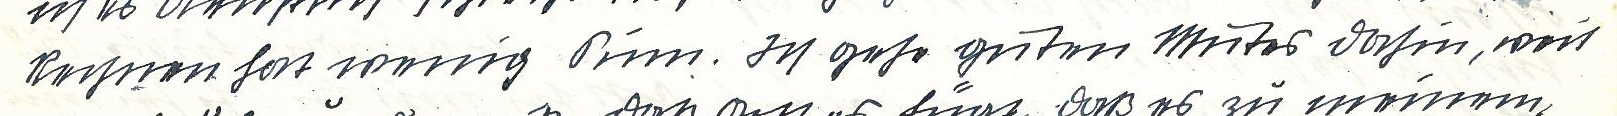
Rechnen hat wenig Sinn. Ich gehe guten Mutes dorthin, weil
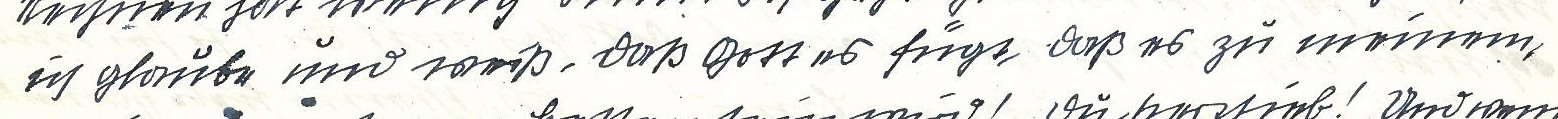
ich glaube und weiß, daß Gott es fügt, daß es zu meinem,
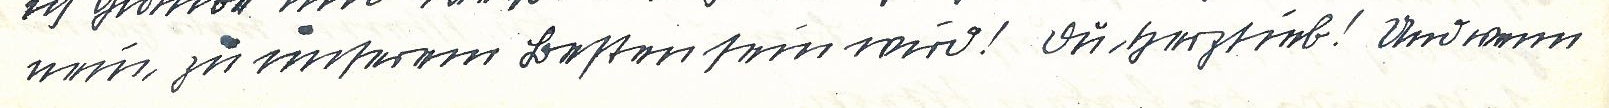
nein unserem Besten sein wird! Du, Herzlieb! Und wenn
